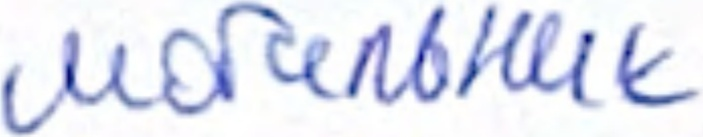могильник
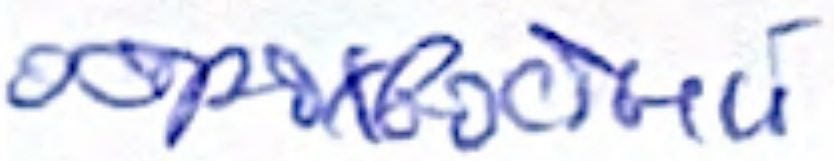острохвостый
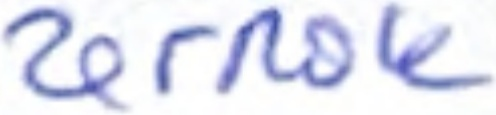чеглок
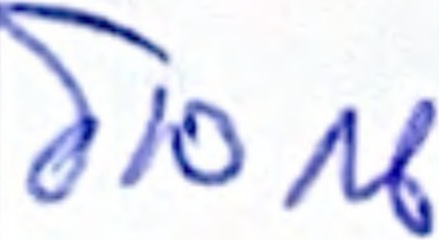бюль
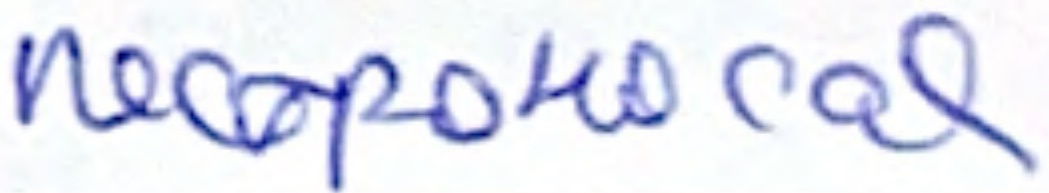пестроносая
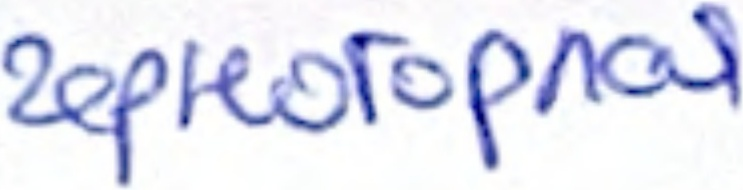черногорлая
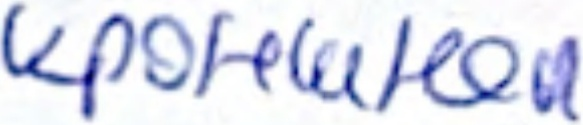кроншнеп
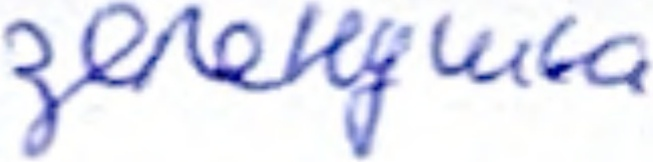зеленушка
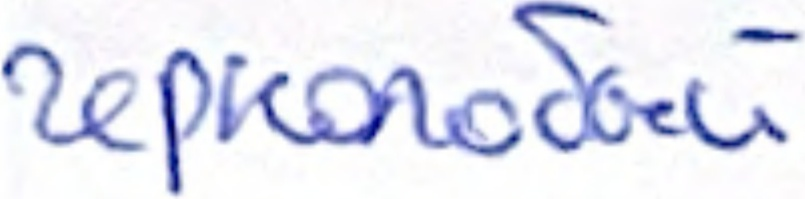чернолобый
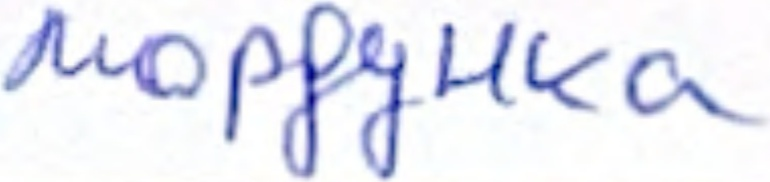мордунка
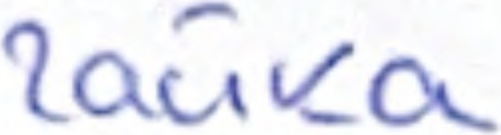чайка
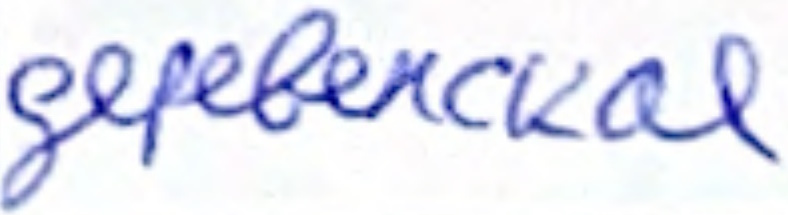деревенская
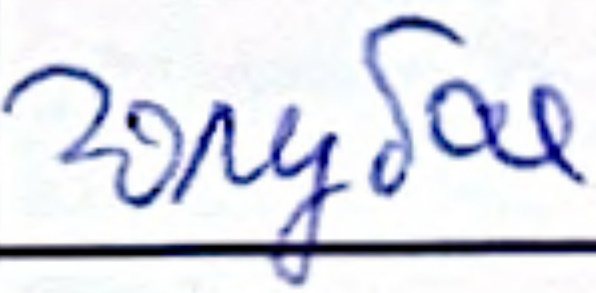голубая
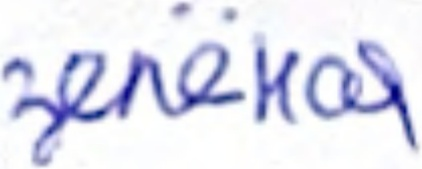зелёная
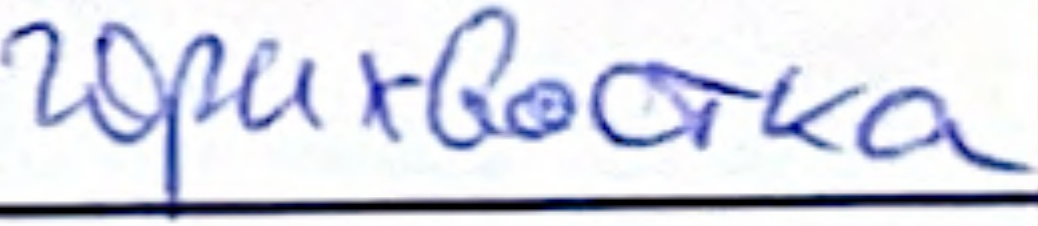горихвостка
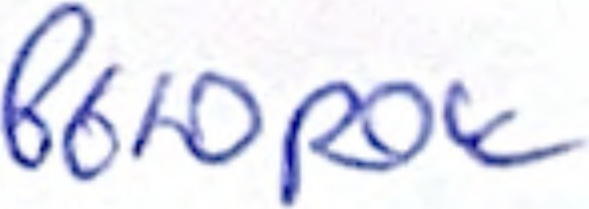вьюрок
